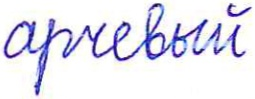арчевый
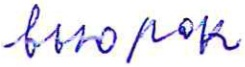вьюрок
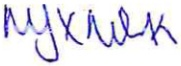пухляк
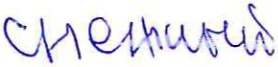снежный
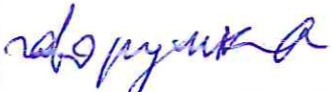говорушка
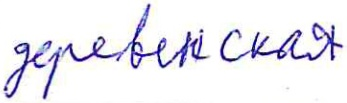деревенская
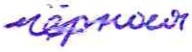чёрная
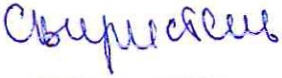свиристель
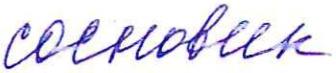сосновик
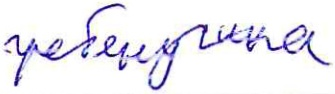гребенушка
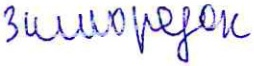зимородок
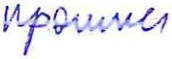крошка
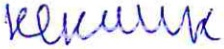кеклик
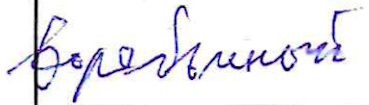воробьиный
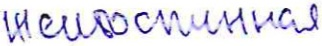желтоспинная
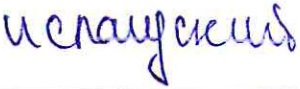исландский
